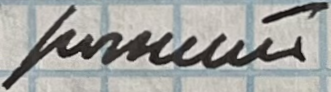рыжий
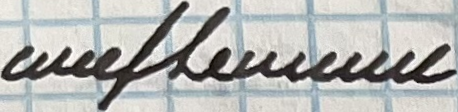стервятник
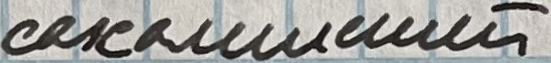сахалинский
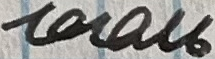гоголь
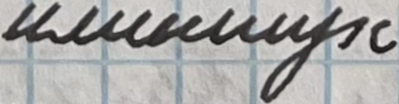клинтух
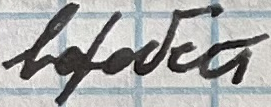воробей
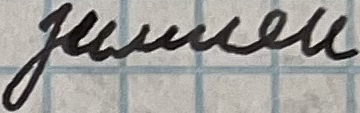зимняк
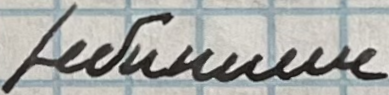рябинник
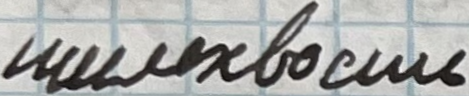шилохвость
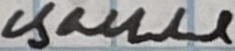цапля
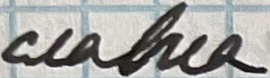славка
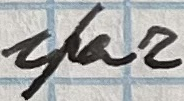грач
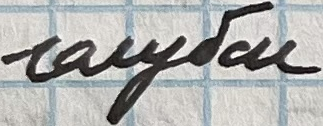голубок
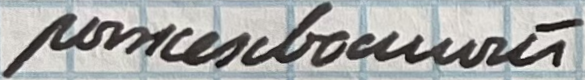рыжехвостый
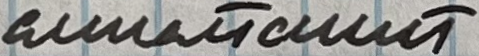алтайский
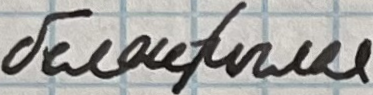белокрылая
